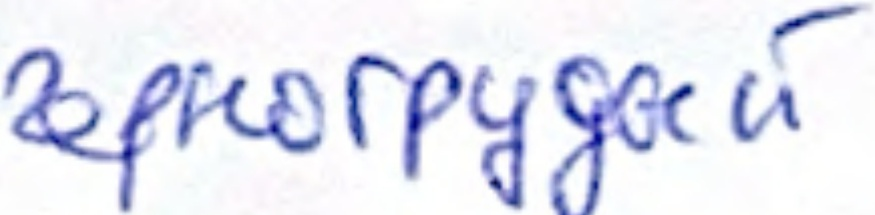черногрудый
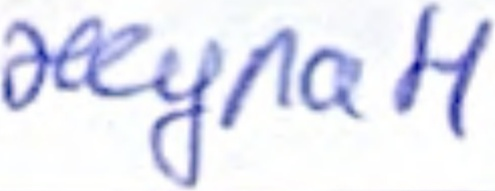жулан
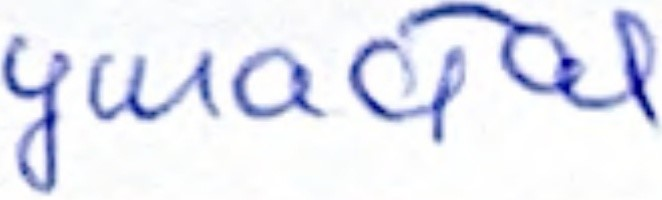ушастая
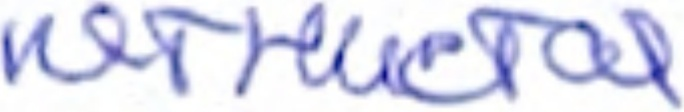пятнистая
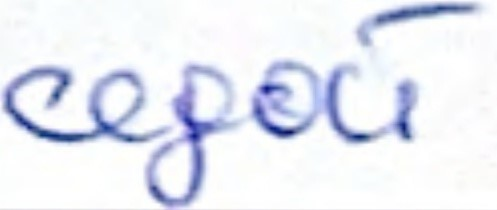седой
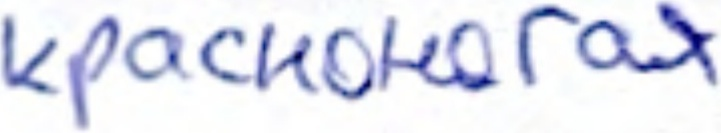красноногая
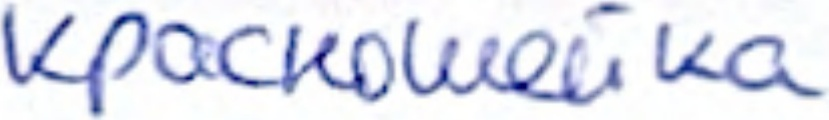красношейка
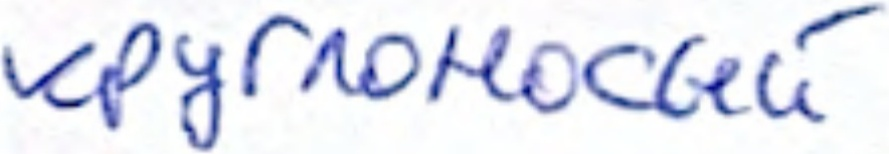круглоносый
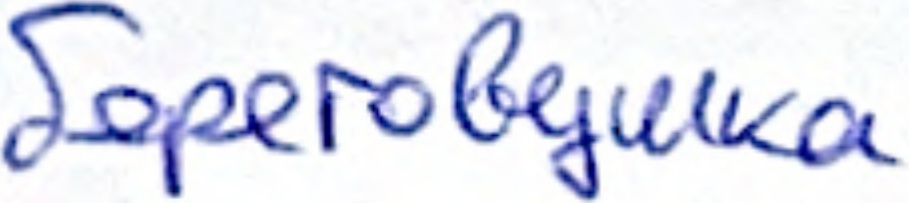береговушка
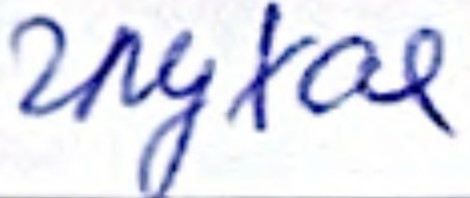глухая
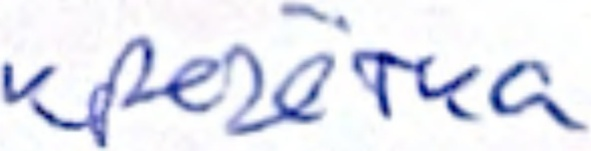кречётка
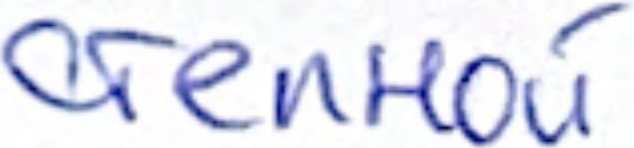степной
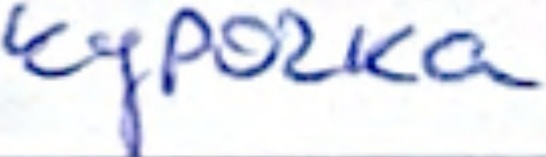курочка
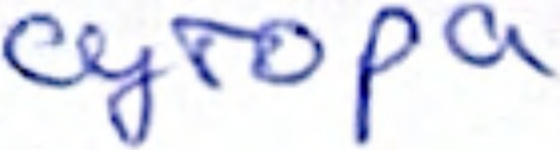сутора
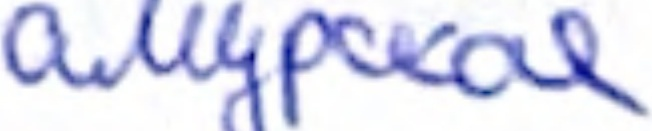амурская
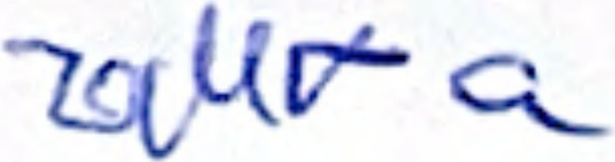чомга
